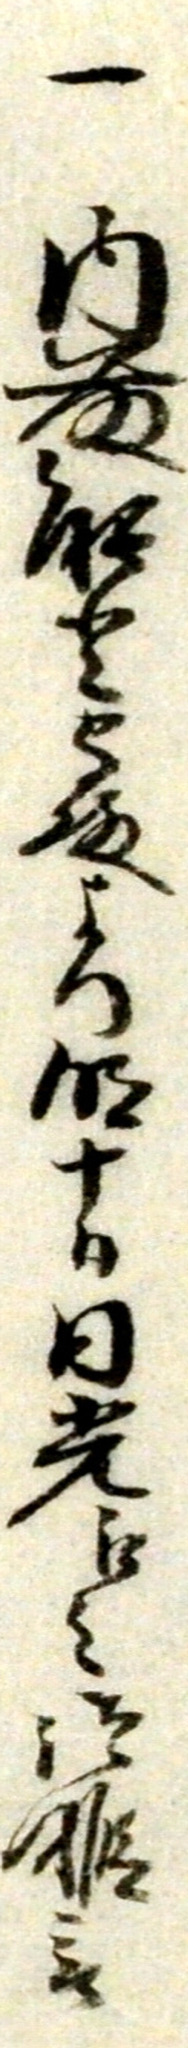一内藤能登守殿ゟ明十日日光江之御暇被
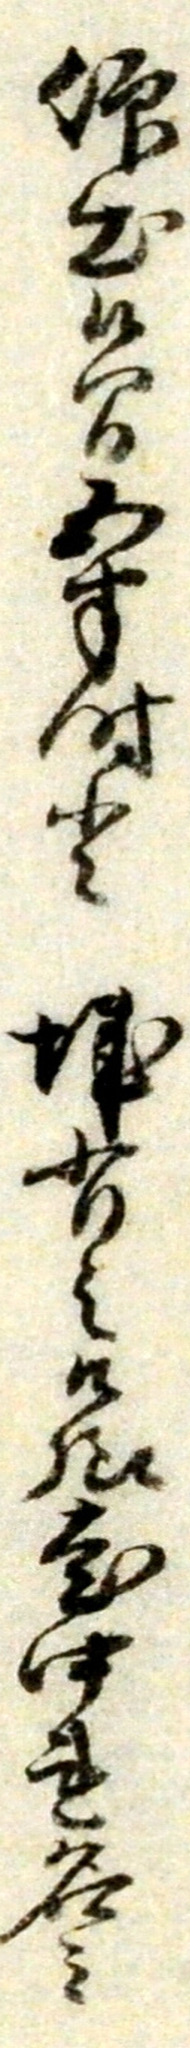仰出候間五半時登城有之候様老中連名之
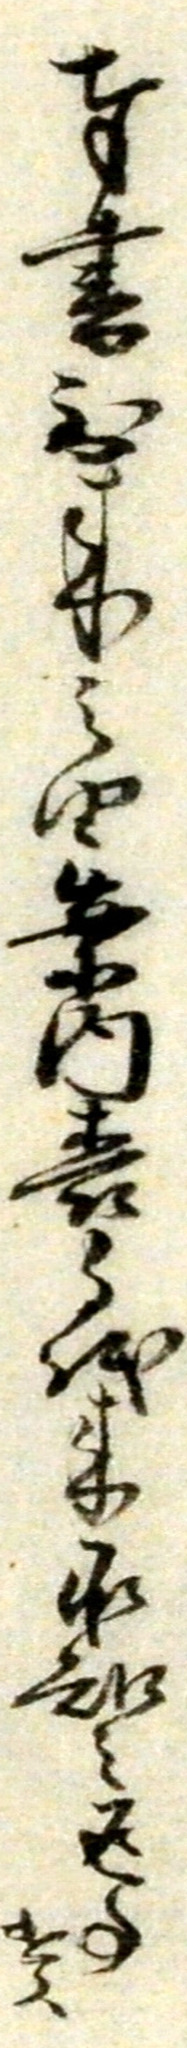奉書到来之由案内表手紙来承知之返事遣ㇲ
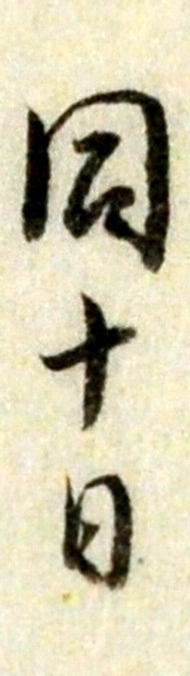同十日
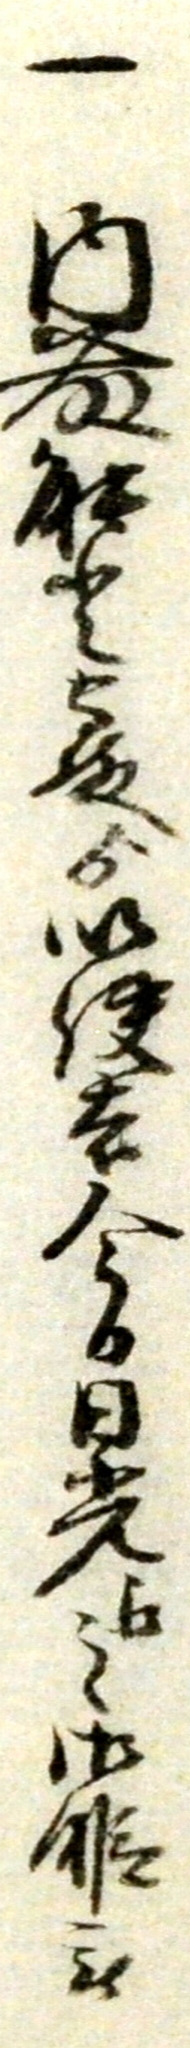一内藤能登守殿ゟ明十日日光江之御暇被
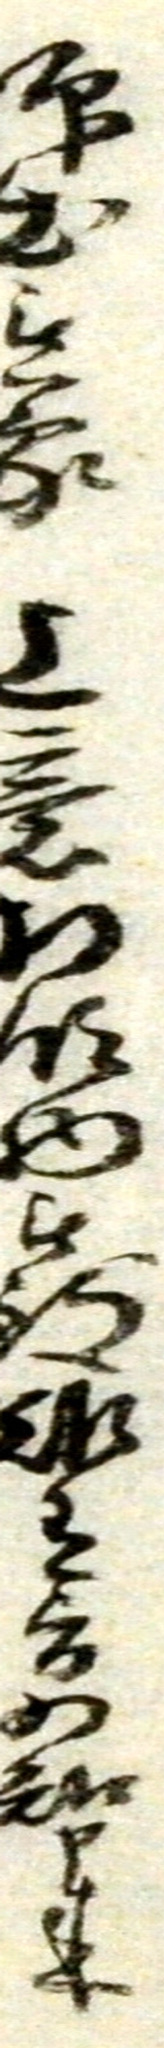仰出被蒙上意拝領物被致難有旨為知申来

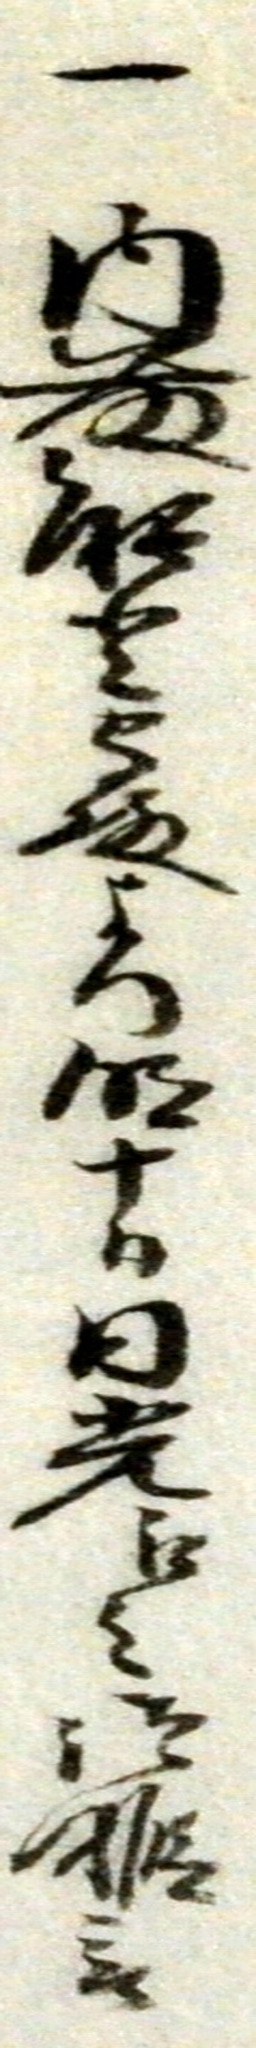一内藤能登守殿より明十日日光江之御暇被
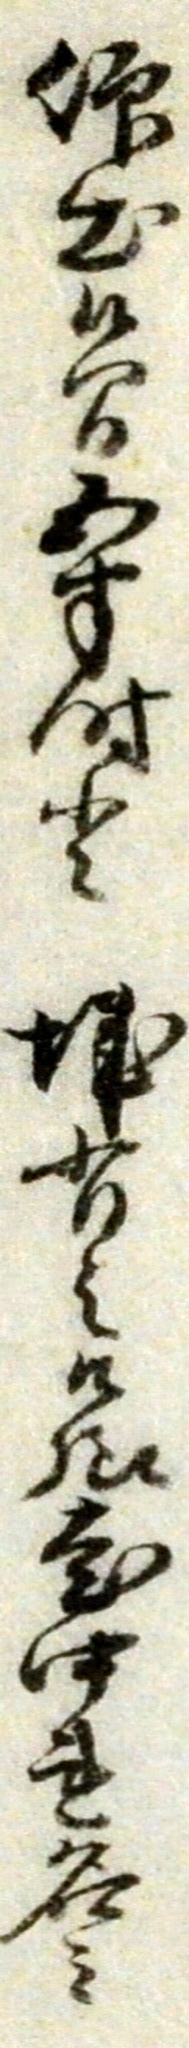仰出候間五半時登城有之候様老中連名之
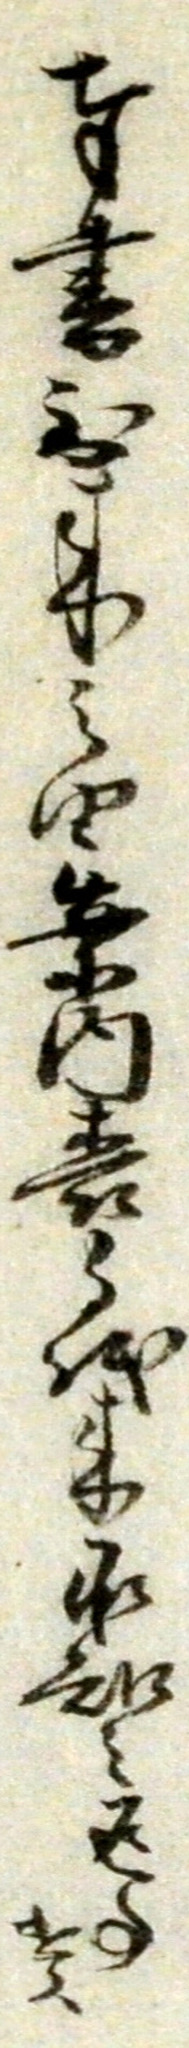奉書到来之由案内表手紙来承知之返事遣ㇲ
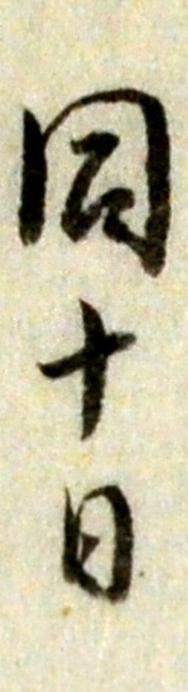同十日
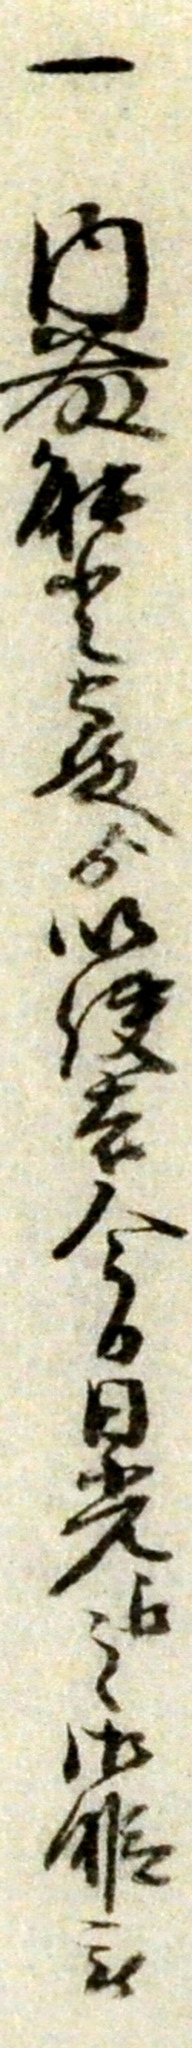一内藤能登守殿ゟ以使者今日日光江之御暇被
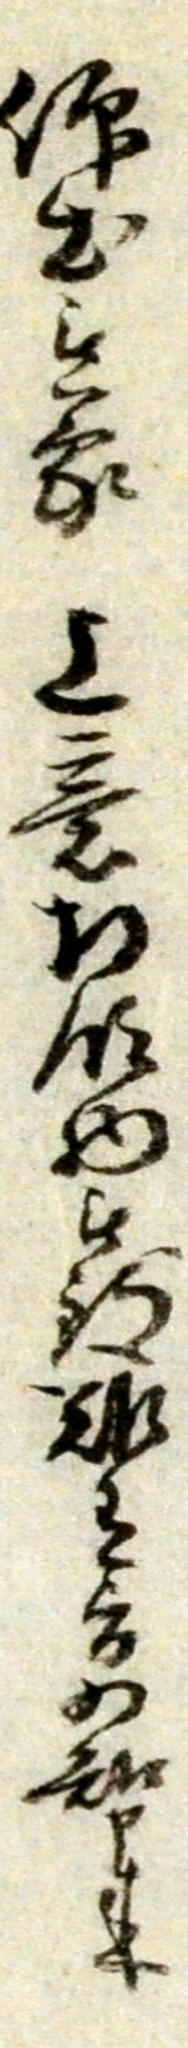仰出被蒙上意拝領物被致難有旨為知申来
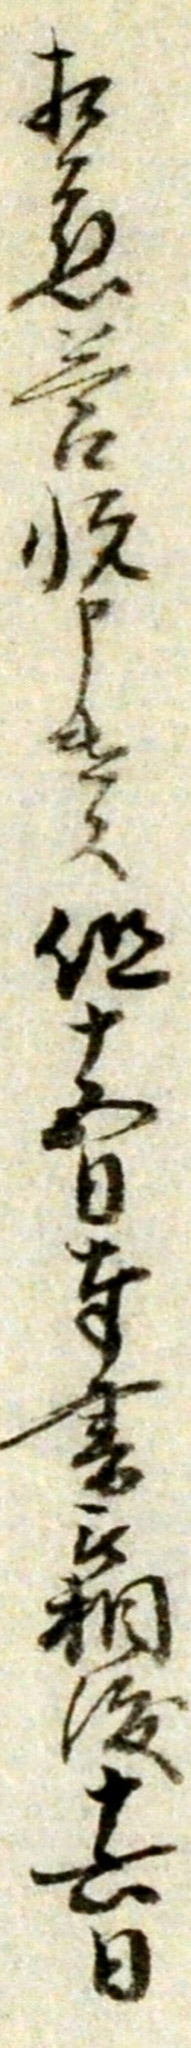相応答悦申遣ㇲ但十五日奉書被相渡十六日
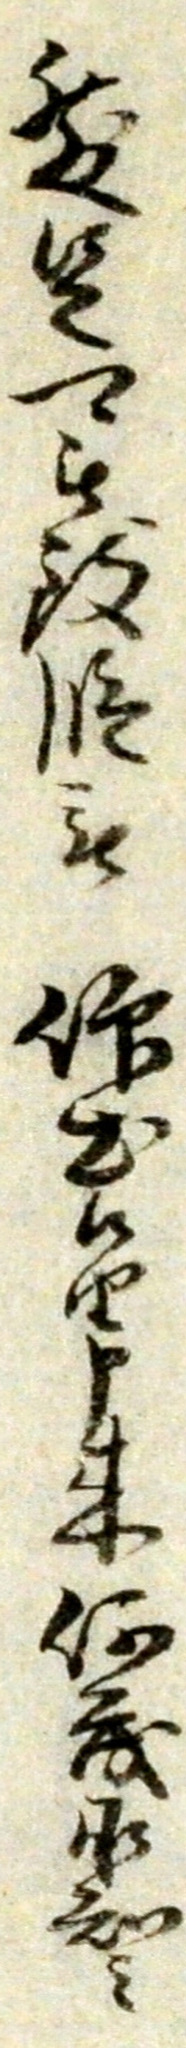発足可被致段被仰出候由申来何茂承知与
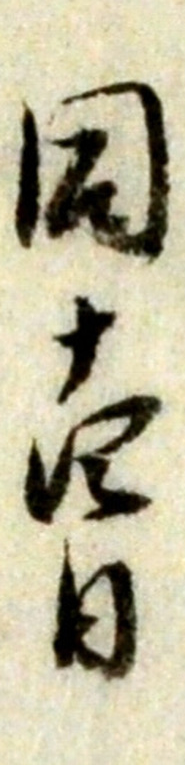同十四日
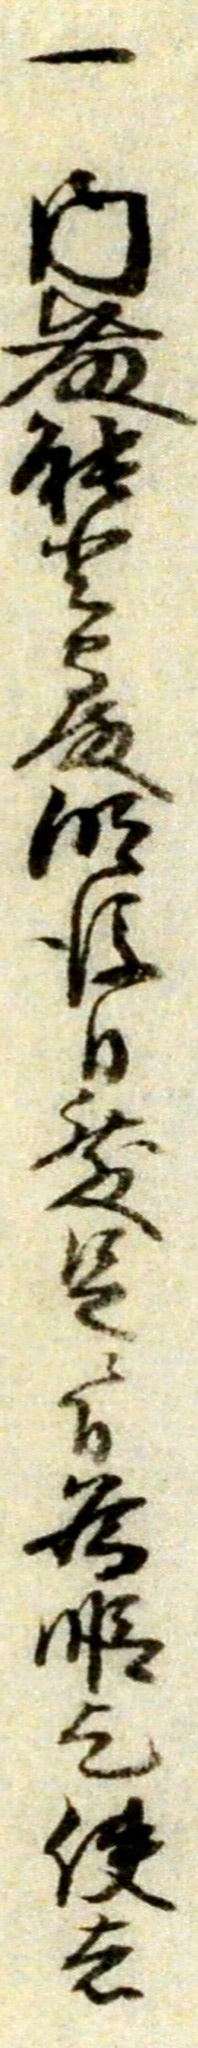一内藤能登守殿明後日発足二付為暇乞使者
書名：日光御名代相勤候節ノ留
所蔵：伊那市立高遠町図書館・合同会社AMANE
